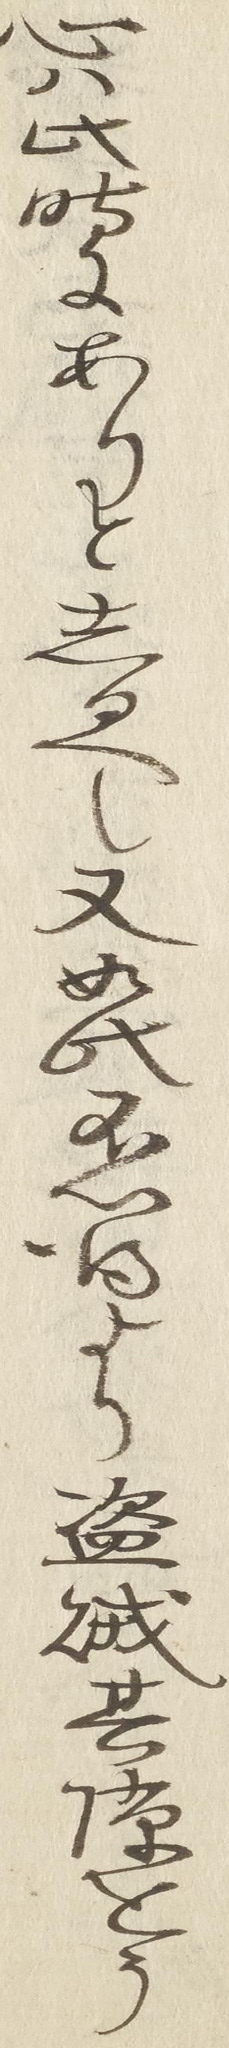心ハ此時にありとしるへし又如此不心得より盗賊其隙をう
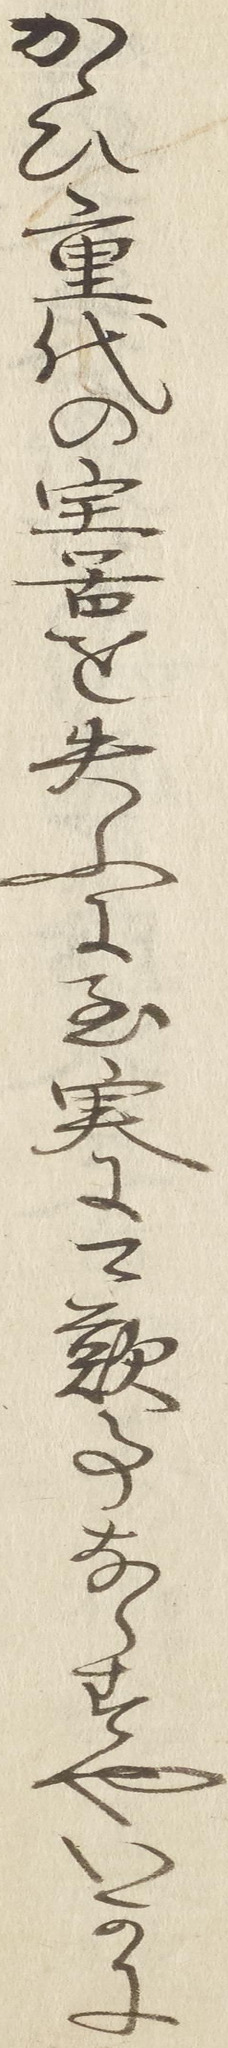かゝひ重代の宝器を失ふに至実に歎事ならすやいかに
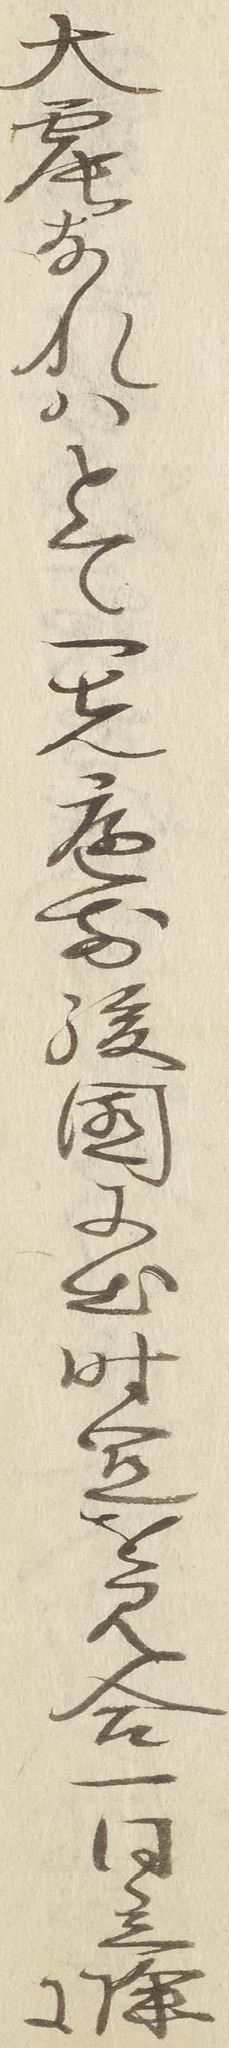大震なれハとて一先庭前後園に出時宜を見合一同立除に
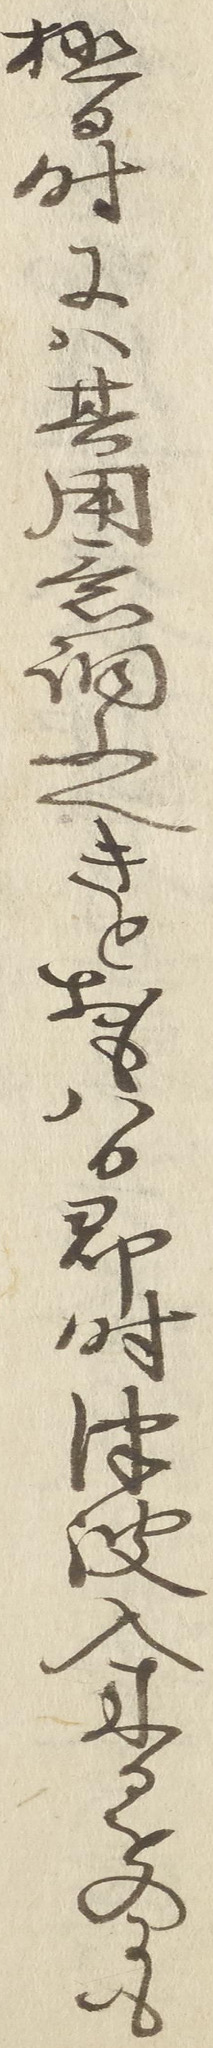極る時にハ其用意調ふへきとおもハる即時津波入来るものにも

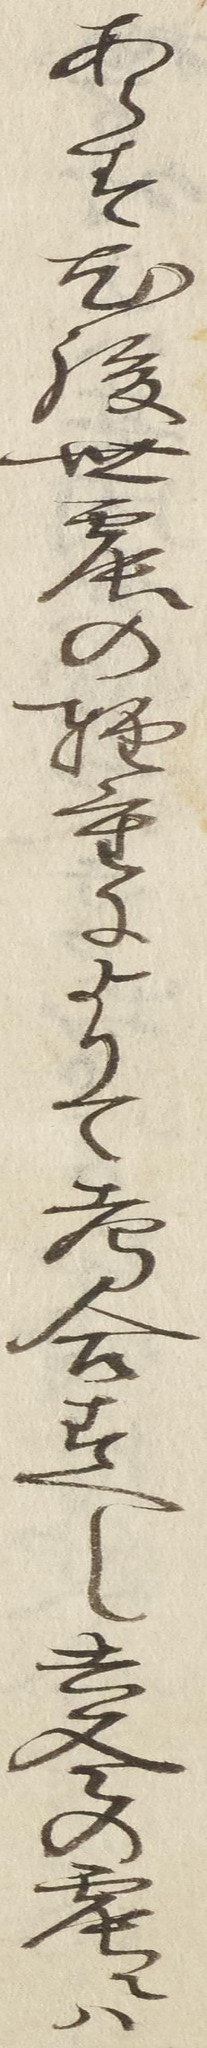あらす尤後世震の軽重によりて考合すへし去冬の震には
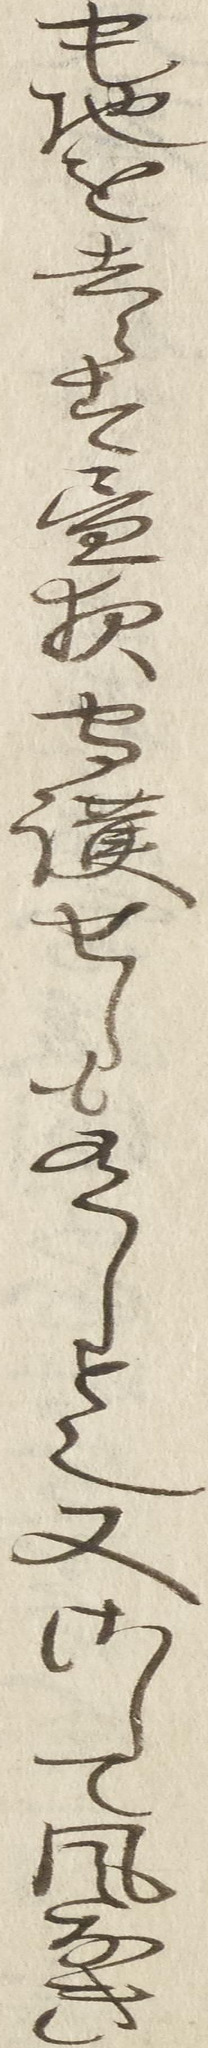宅地を去らす昼夜守護せしも有しと也又さして風なき
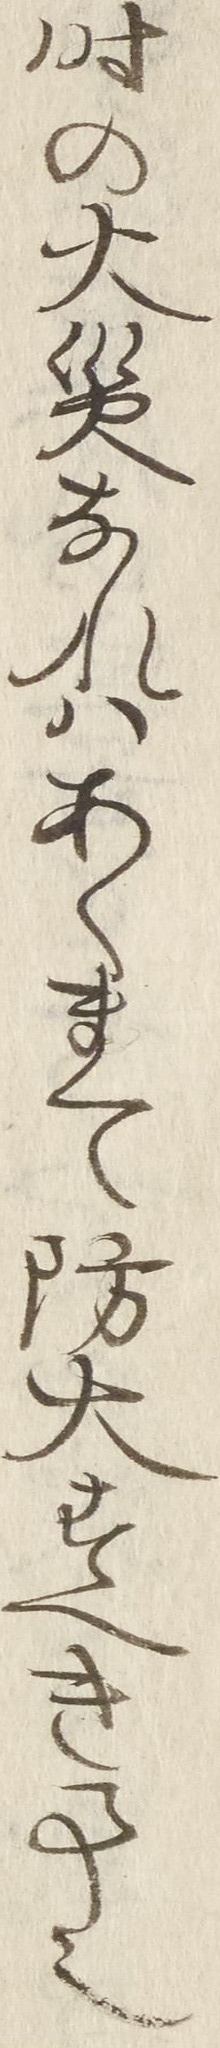時の火災なれはあくまて防火すへき事也
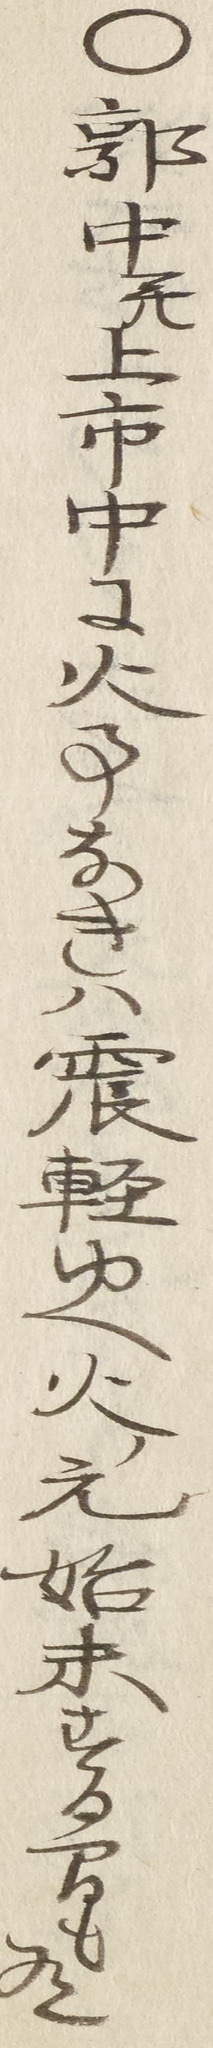〇郭中幷上市中に火事なきは震軽ゆへ火の元始末する間も有
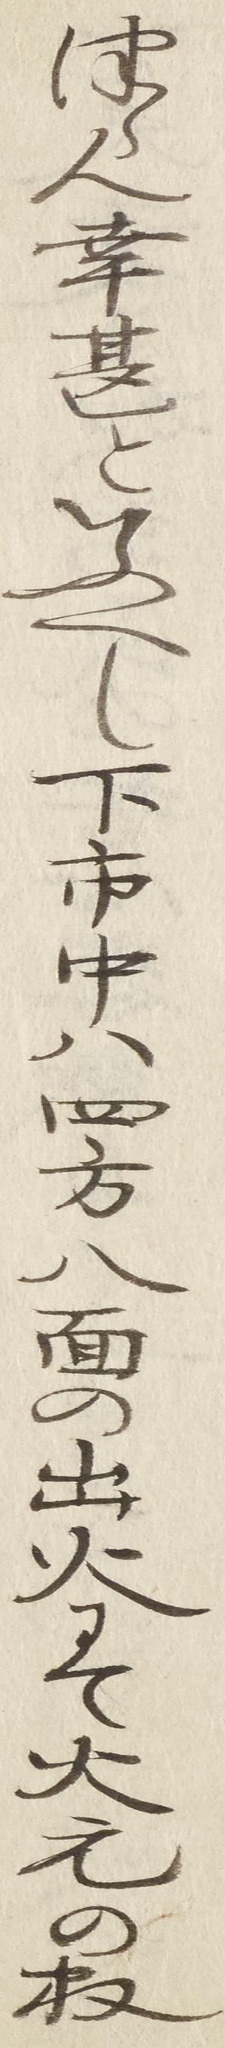つらん幸甚といふへし下市中は四方八面の出火にて火元の数
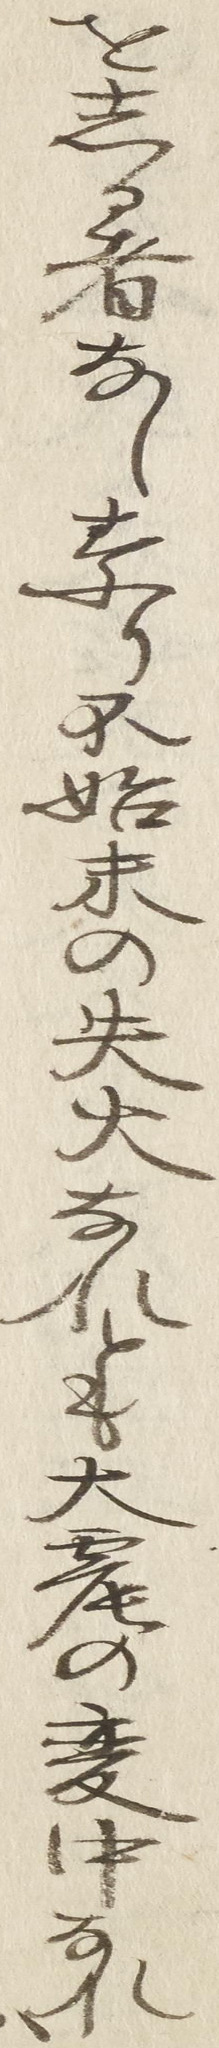をしる者なし素り不始末の失火なれとも大震の変中なれは
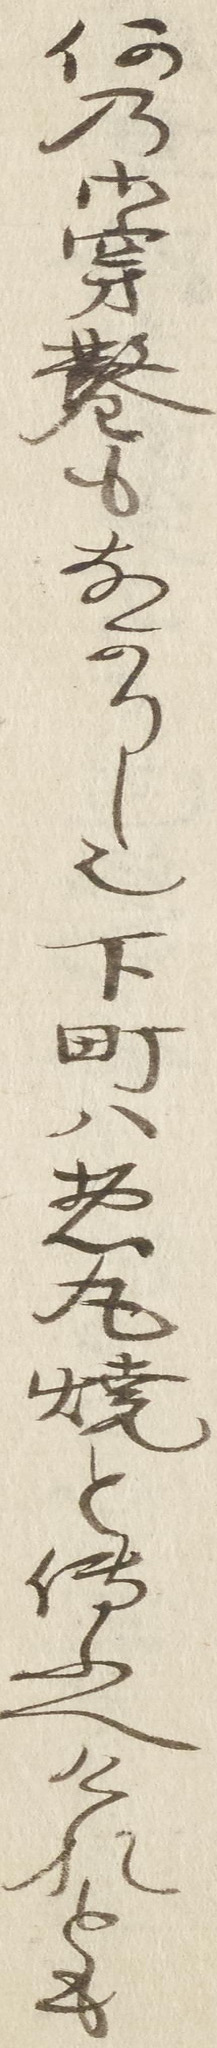何の御穿鑿もなかりし也下町は惣丸焼と伝ふへけれとも
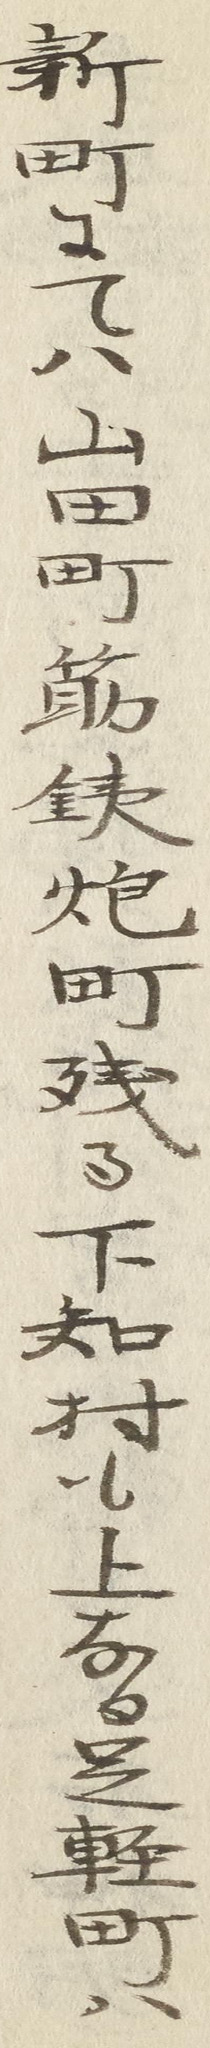新町にては山田町筋鉄炮町残る下知村も上なる足軽町は
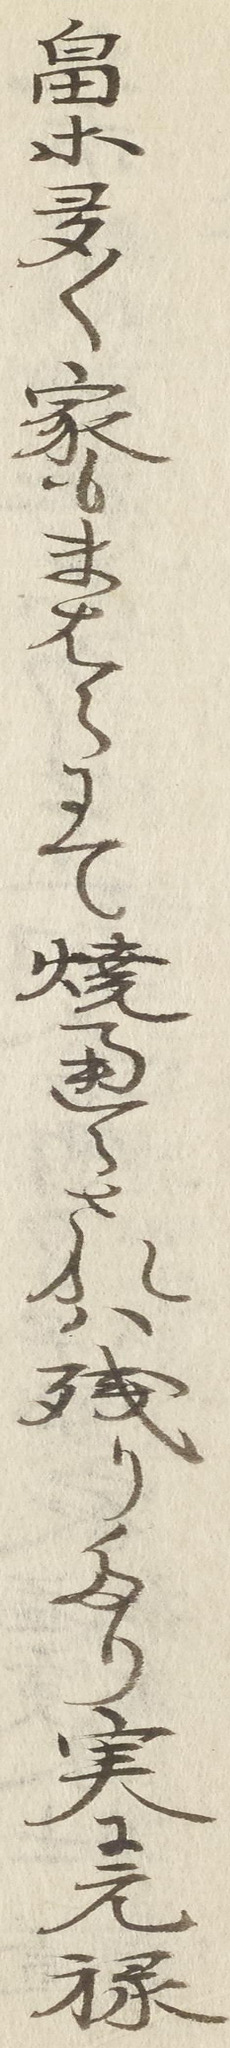畠等多く家もまはらにて焼通しされは残りたり実に元禄
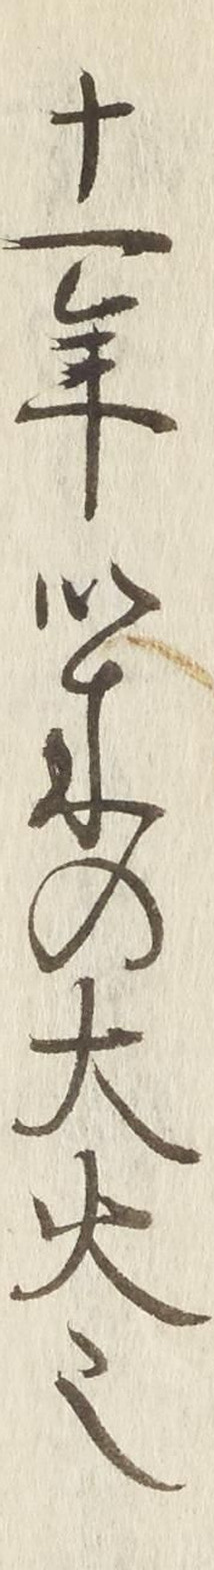十一年以来の大火也
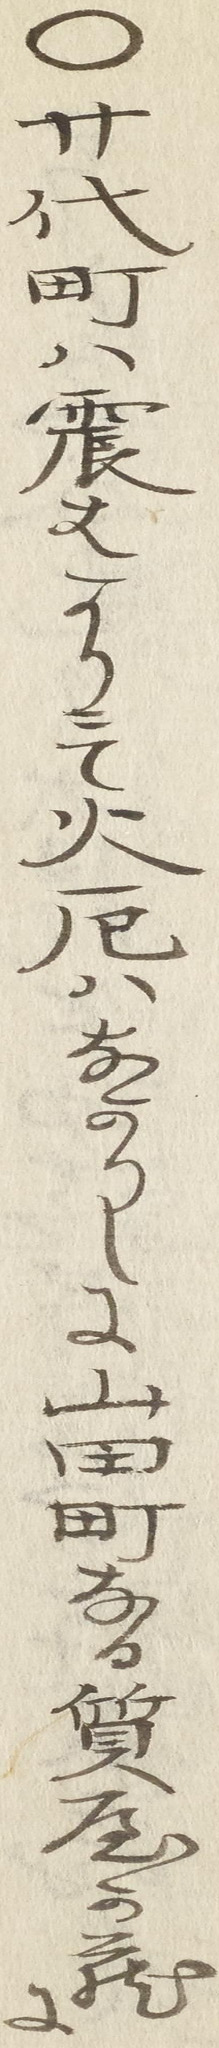〇廿代町は震はかりにて火厄はなかりしに山田町なる質屋か蔵に
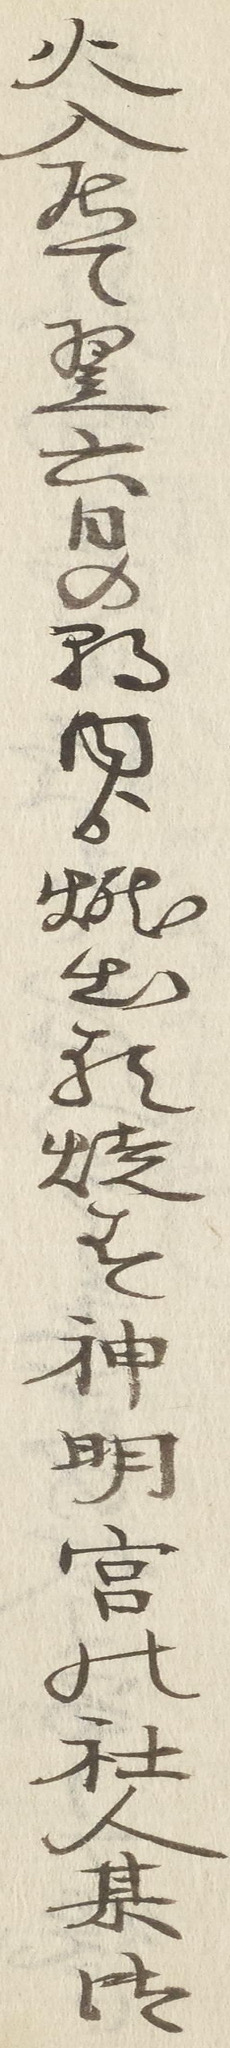火入居て翌六日の朝内より燃出類焼す神明宮の社人某御
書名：地震記　上
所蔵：東京大学地震研究所図書室 Earthquake Research Institute Library, The University of Tokyo, JAPAN
